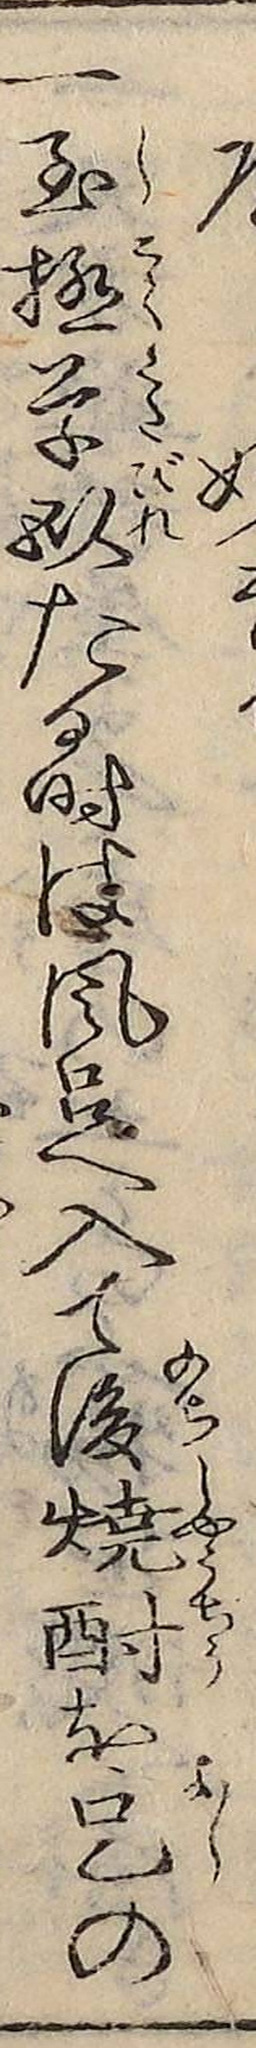一至極草臥たる時は風呂へ入て後焼酎を足の
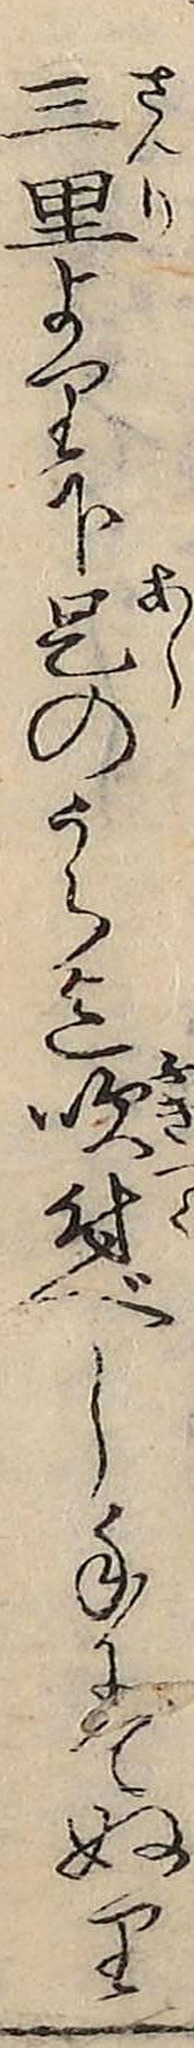三里より下足のうら迄吹付べし手にてぬり
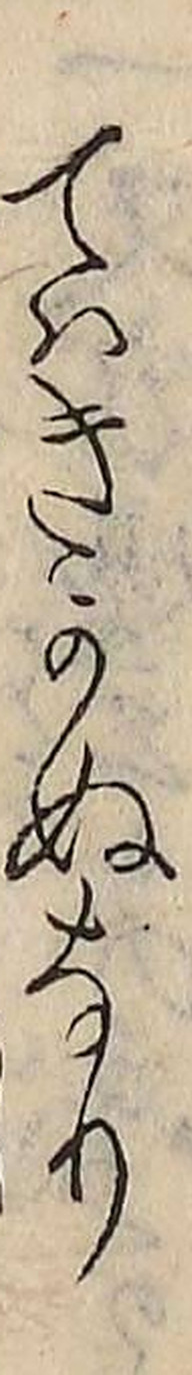てはきかぬなり
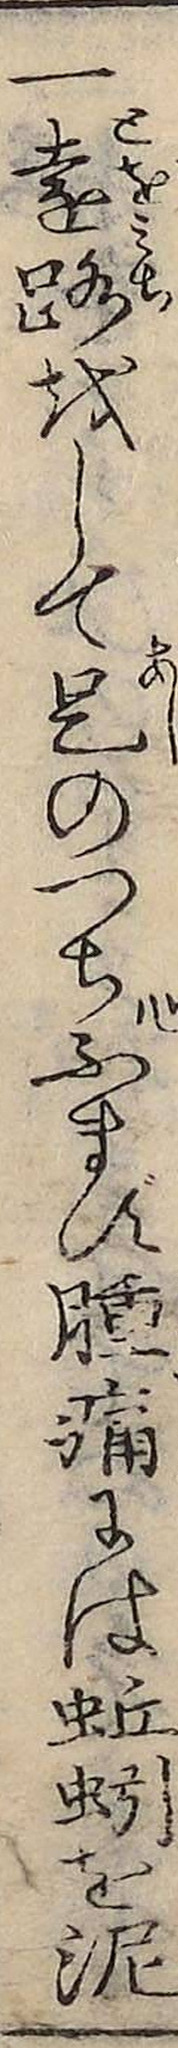一遠路をして足のつちふまず腫痛には蚯蚓を泥
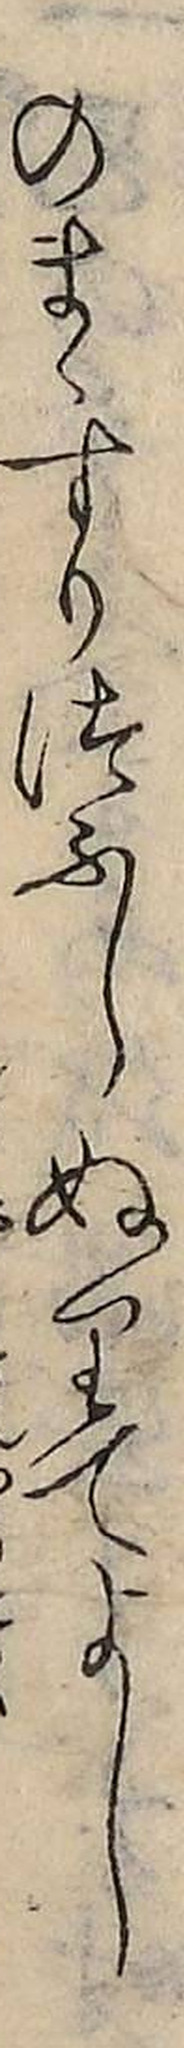のまゝすりつふしぬりてよし
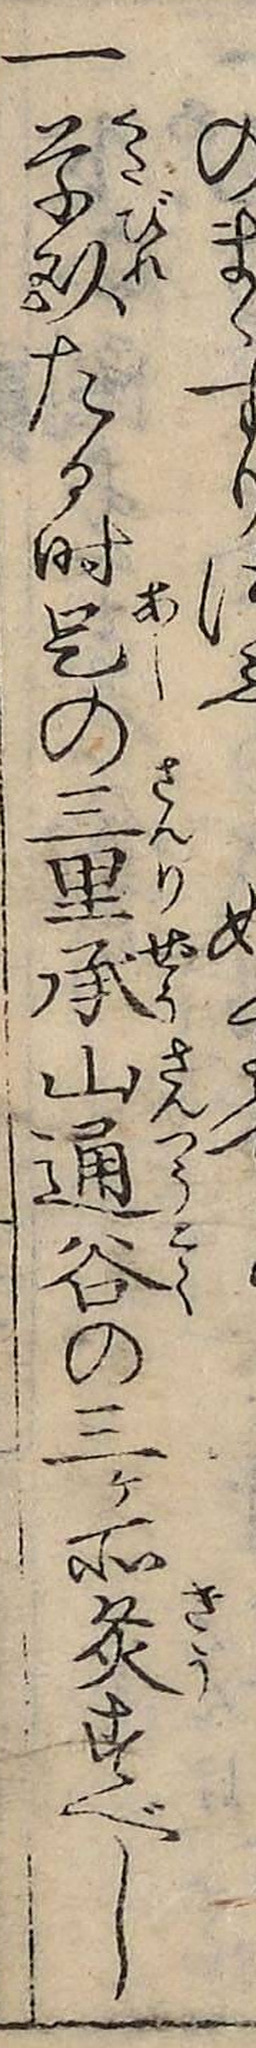一草臥たる時足の三里承山通谷の三所灸すべし

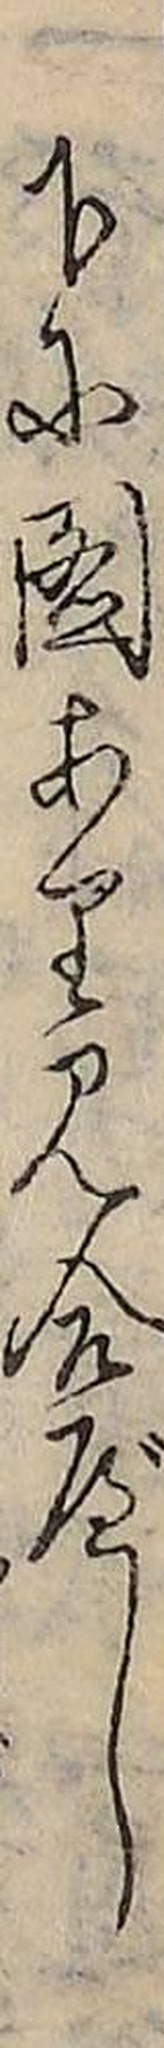下に図あり見合べし
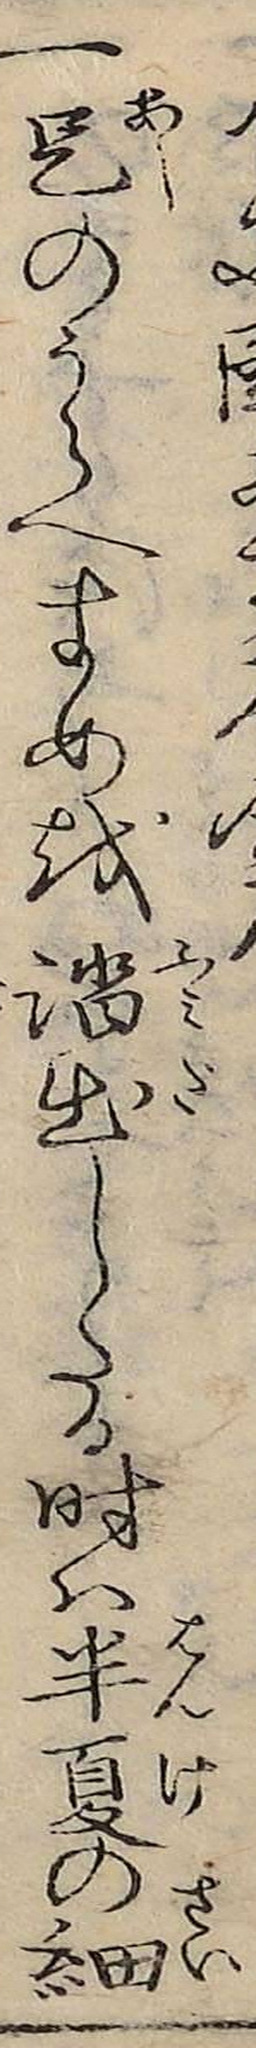一足のうらへまめを踏出したる時は半夏の細
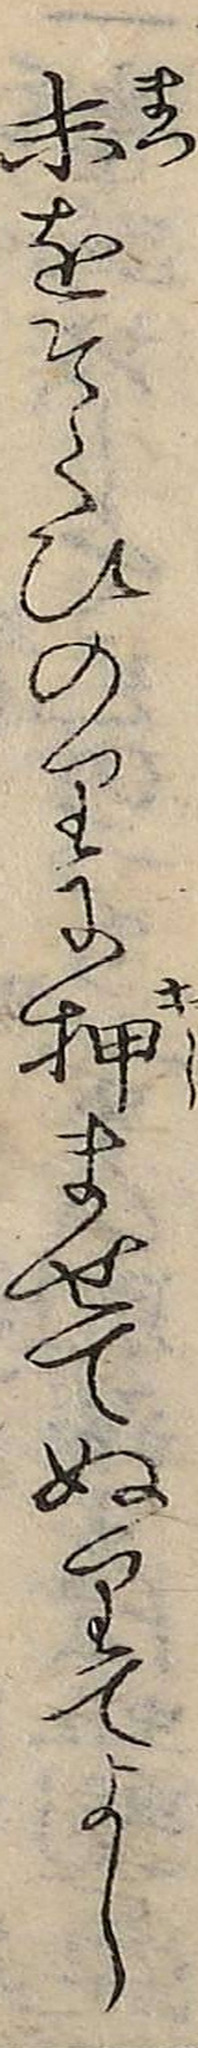末をそくひのりに押ませてぬりてよし
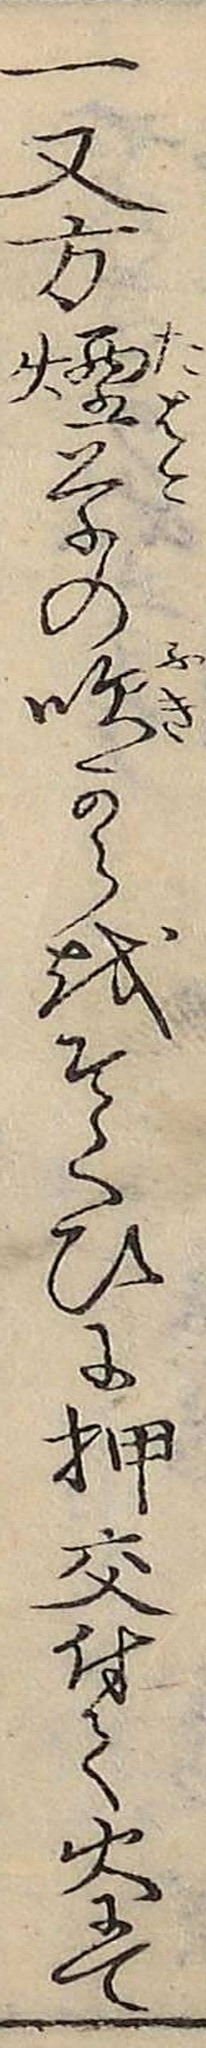一又方煙草の吹からをそくひに押交付て火にて
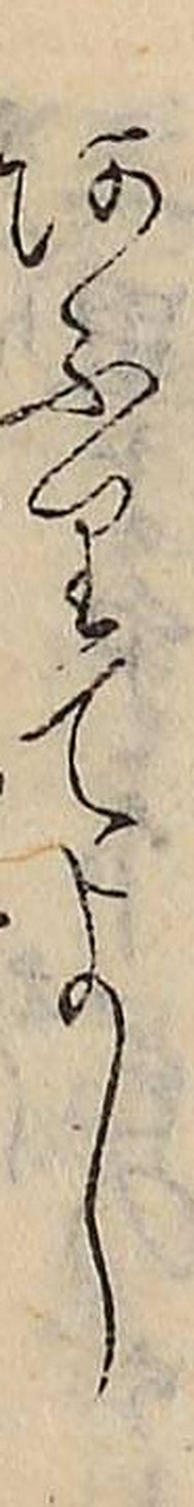あふりてよし
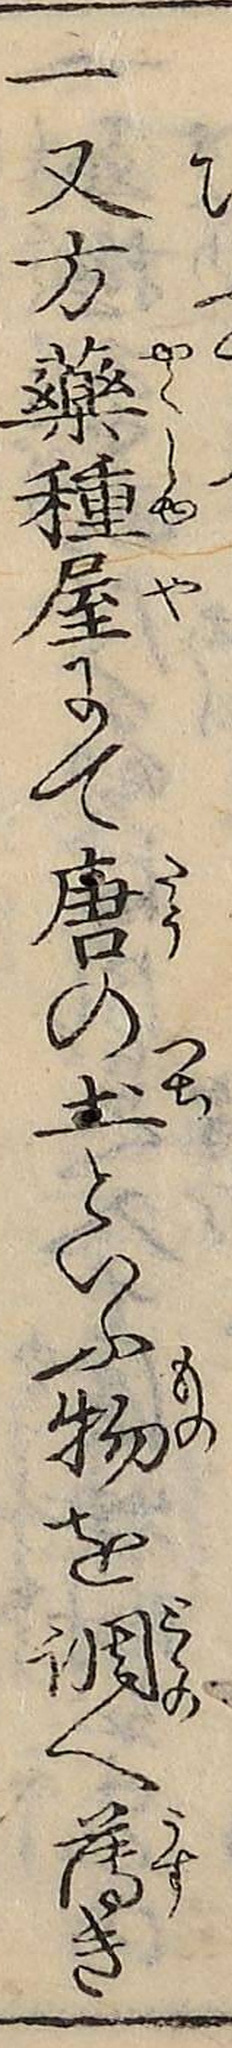一又方薬種屋にて唐の土といふ物を調へ薄き
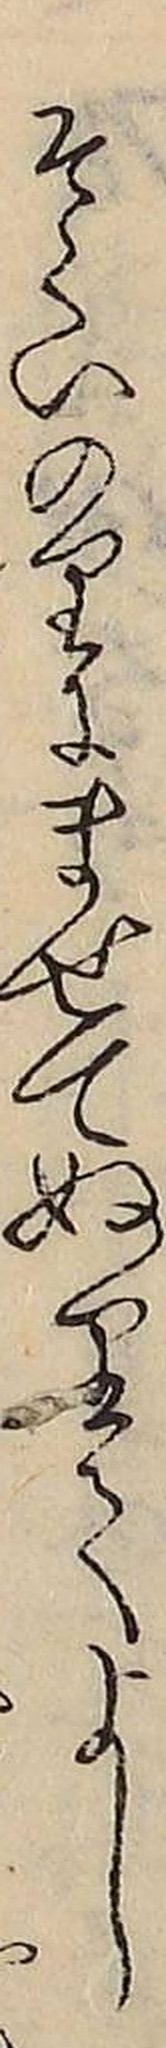そくいのりにませてぬりてよし
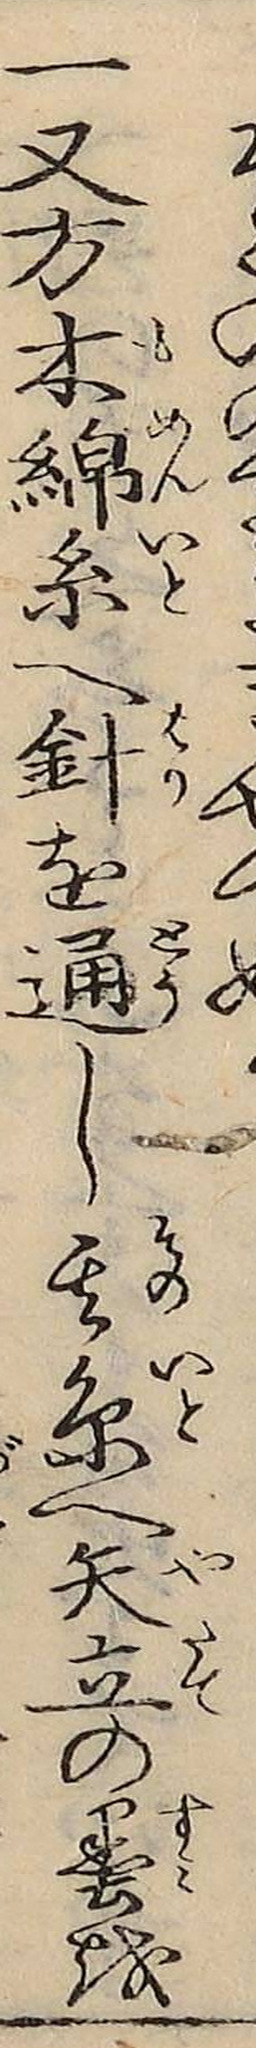一又方木綿糸へ針を通し其糸へ矢立の墨を
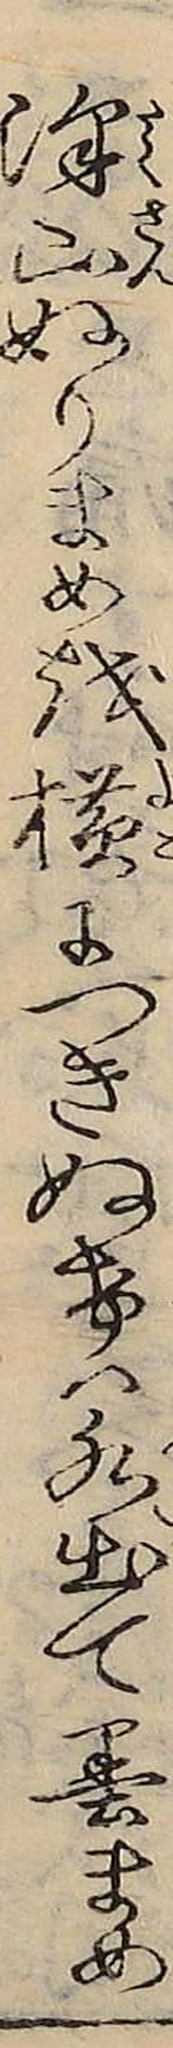沢山ぬりまめを横につきぬけは水出て墨まめ
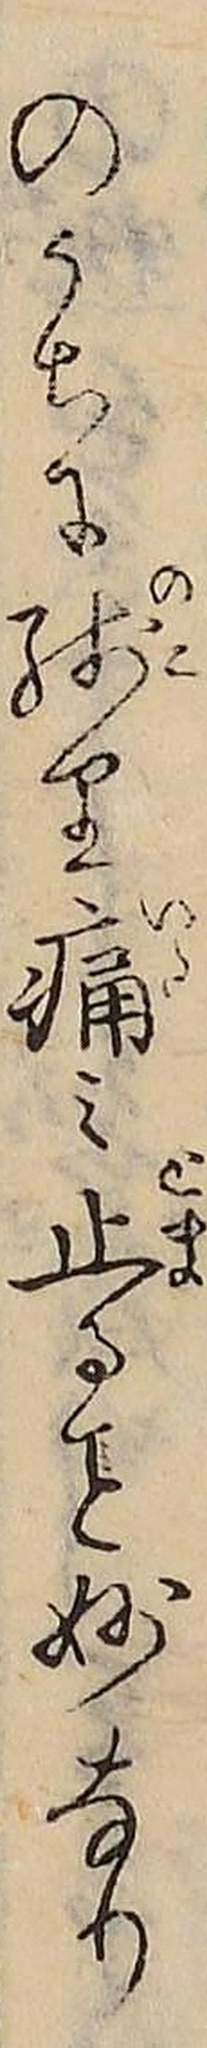のうちに残り痛み止ること妙なり
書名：旅行用心集
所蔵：神戸大学附属図書館 国文学研究資料館
